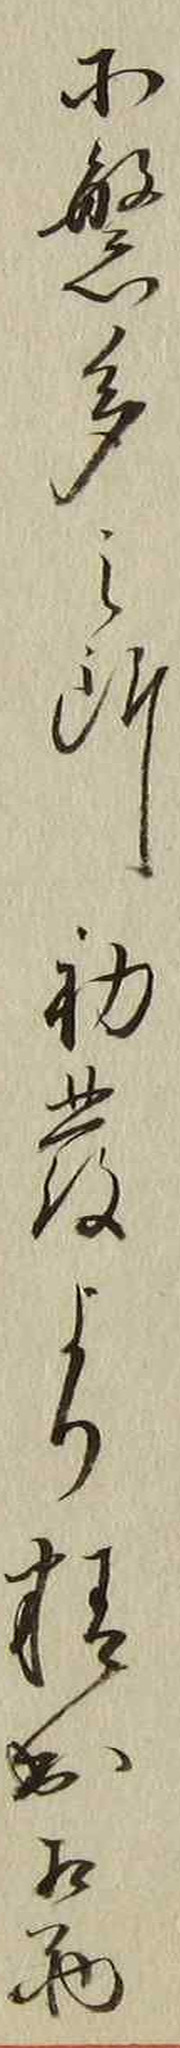所繫多之所初発より精出相勤
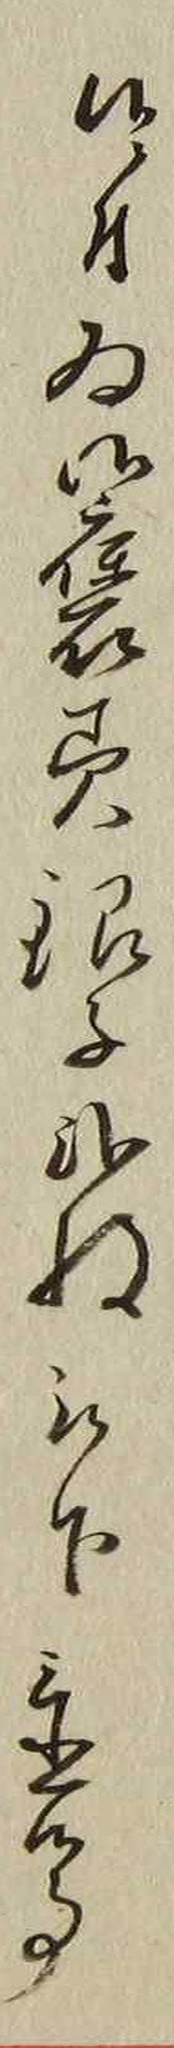候ニ付為御褒美銀子弐枚被下置候事
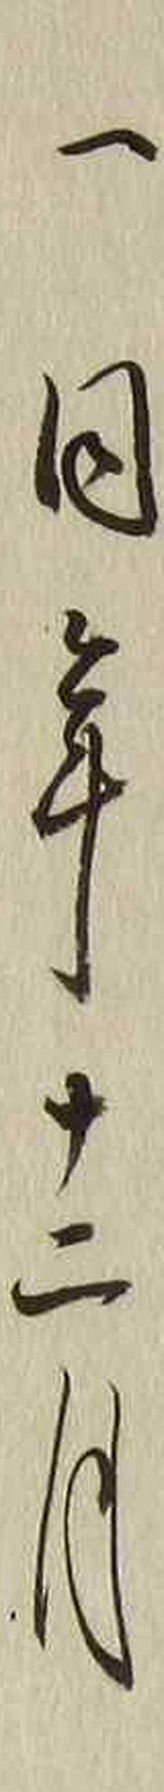一同年十二月
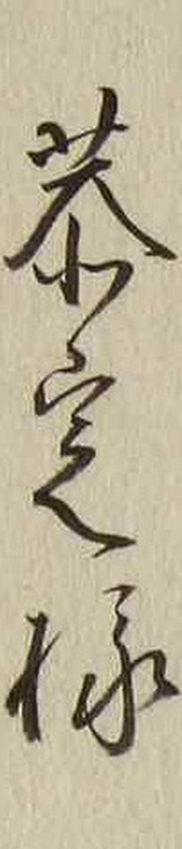恭定様
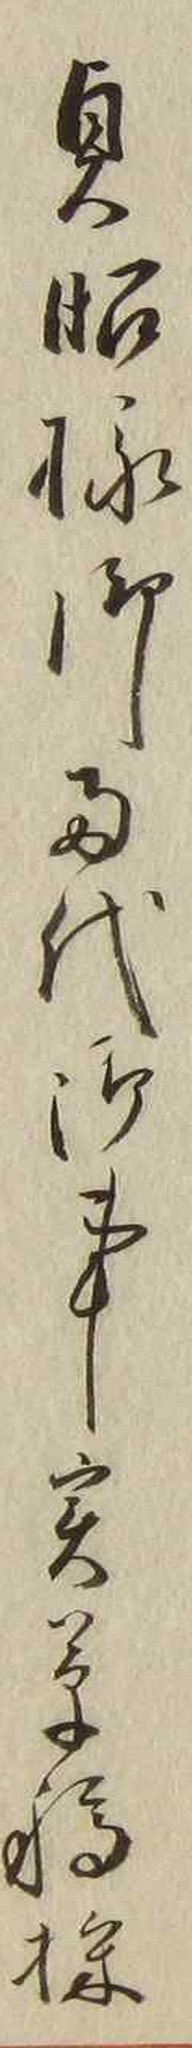貞昭様御両代御事実草福様
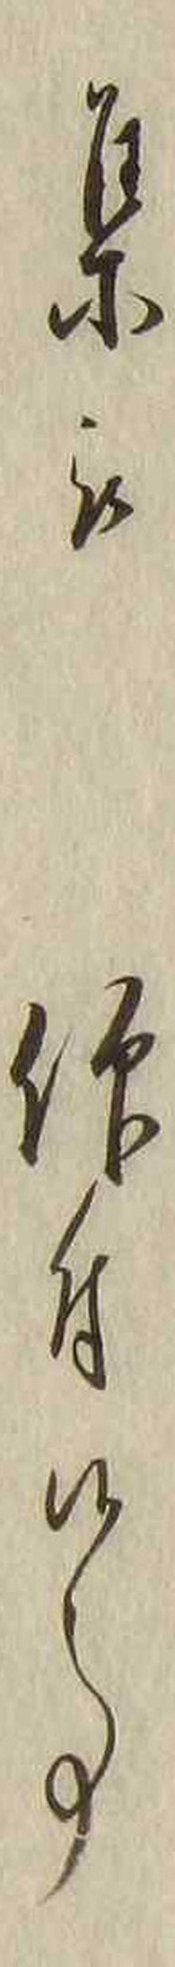集被仰付候事
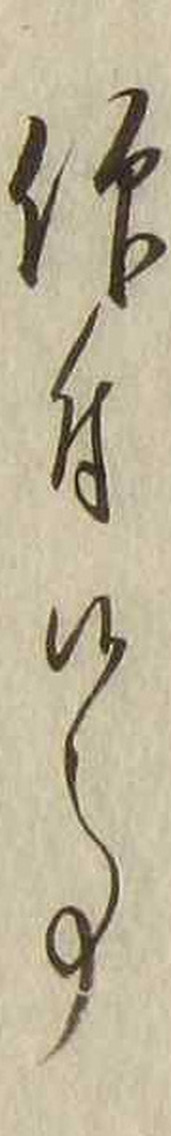仰出候事

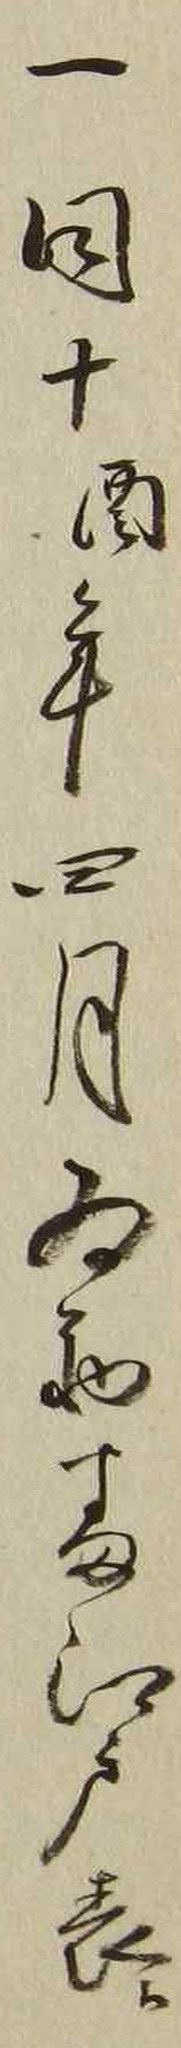一同十酉年四月為勤番江戸表江
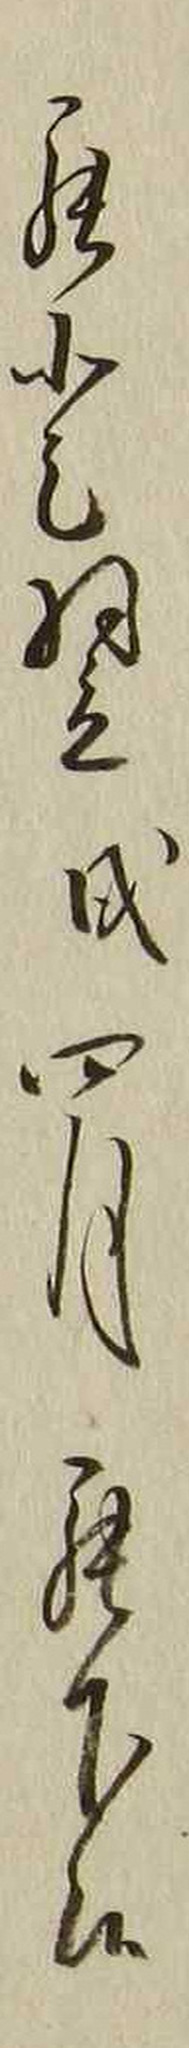罷登翌戌四月罷下候
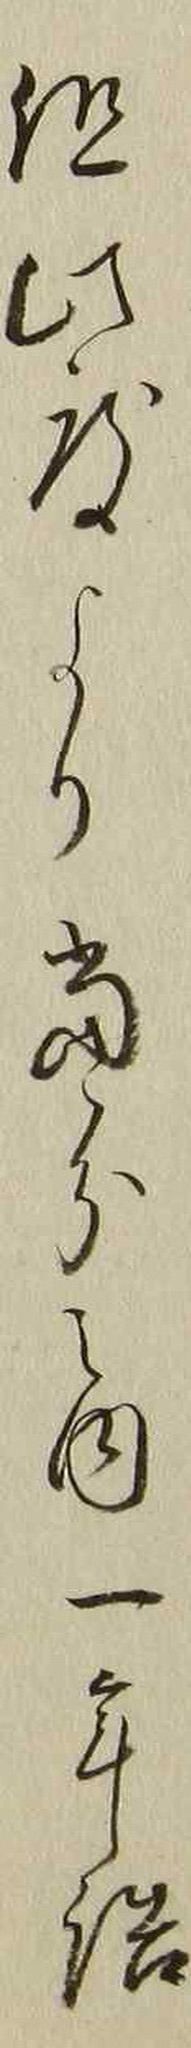但此度より当分之間一年詰
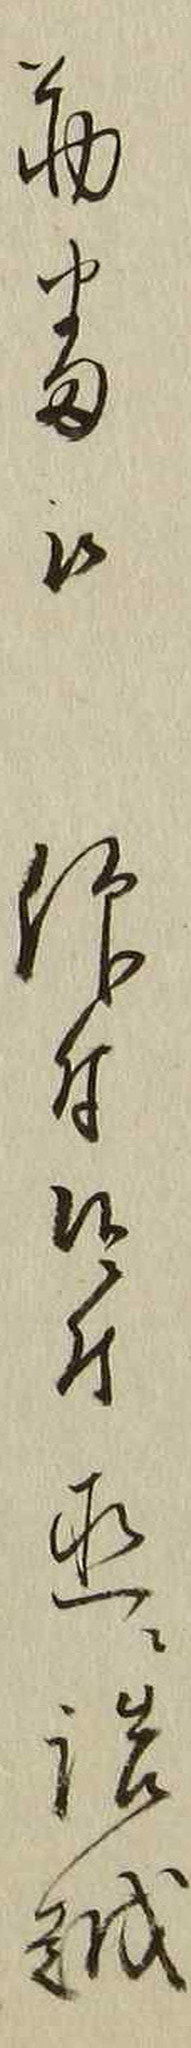勤番被仰付候ニ付直ニ詰越
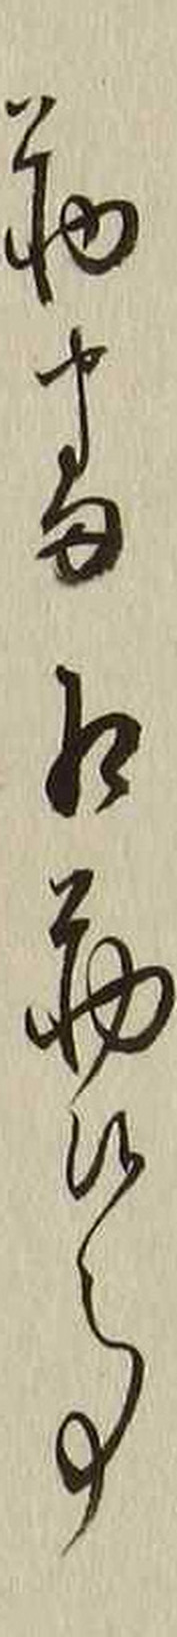勤番相勤候事
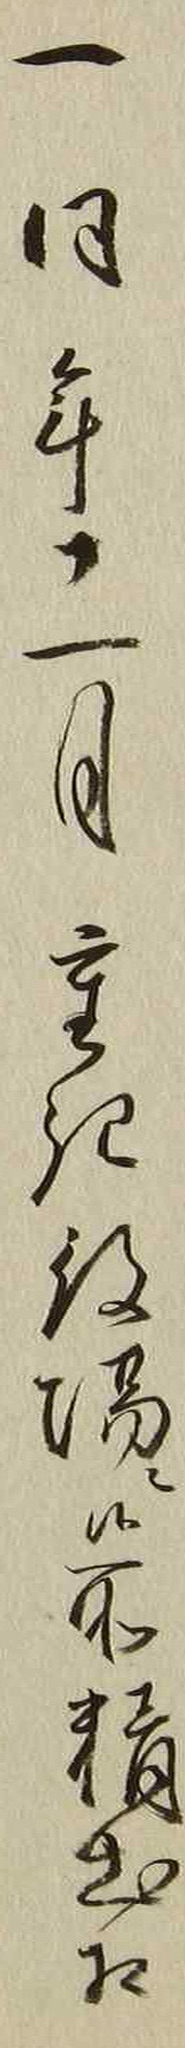一同年十一月重紀役場ニ候所精出相
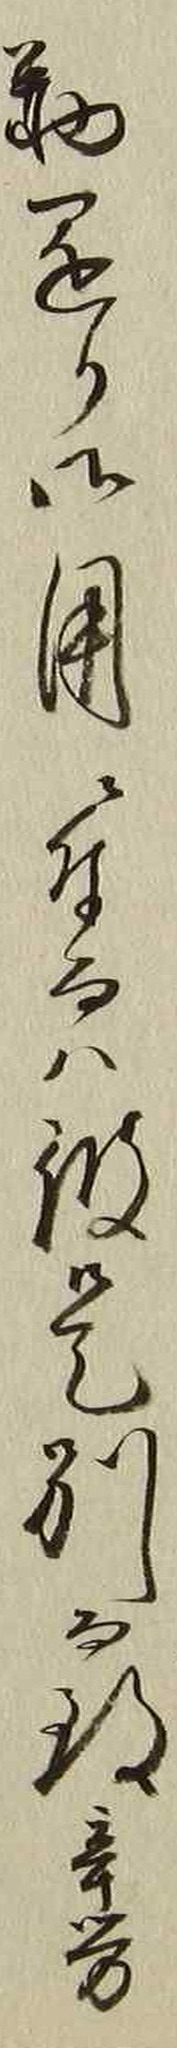勤懸り御用ニ付而ハ彼是別而致辛労
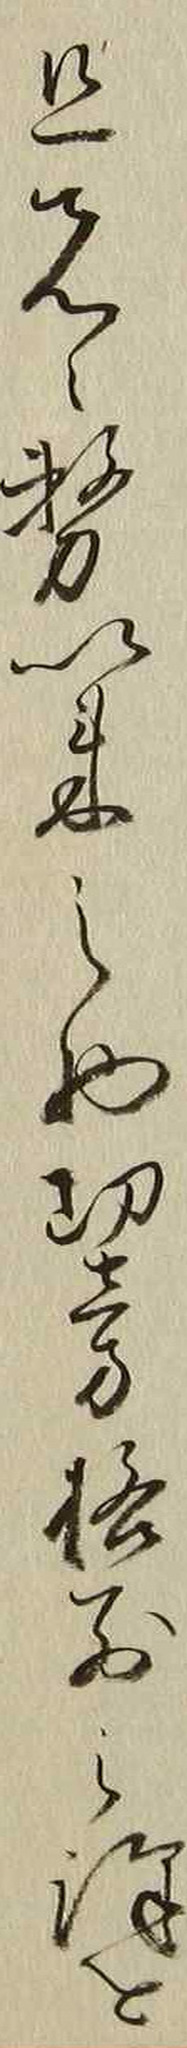且先之務以来之物功旁格別之訳を
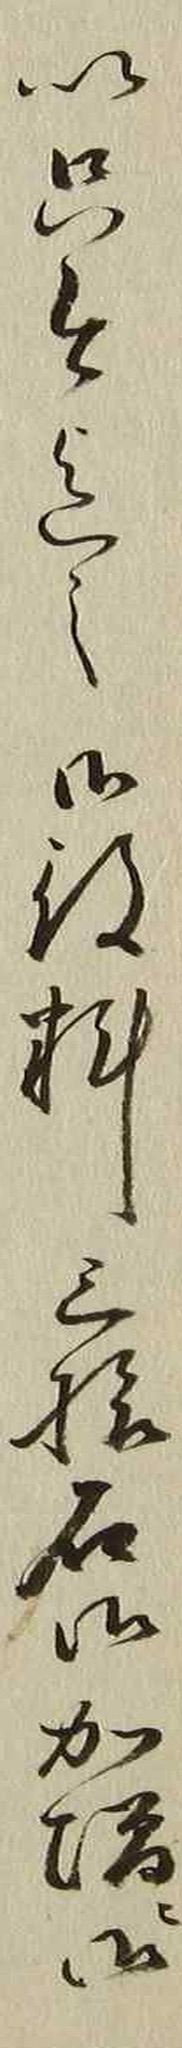以只今迄御役料参拾石御加増ニ御
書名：諸士系譜　巻之68　を之部2
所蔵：会津若松市立会津図書館
